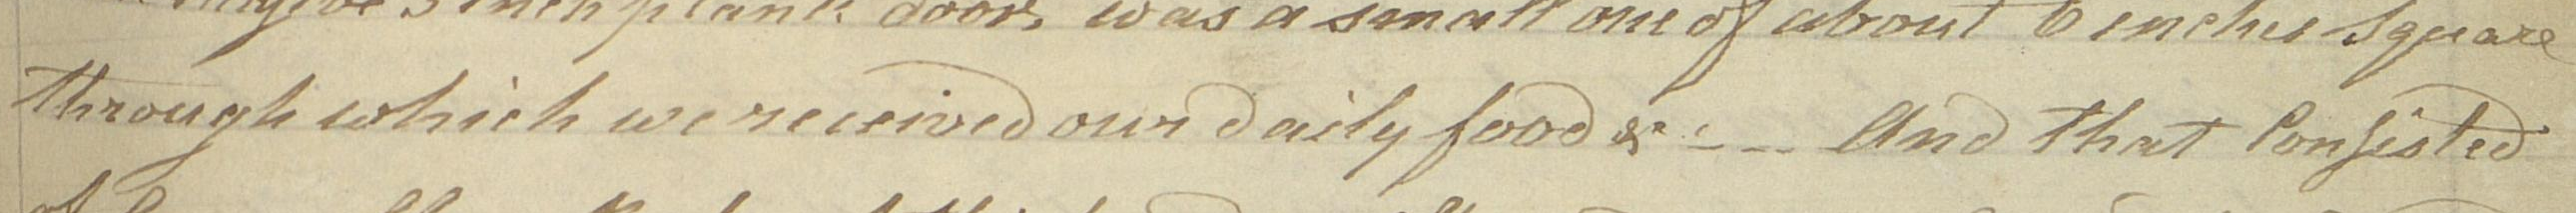through which we received our daily food &^c And that Consisted
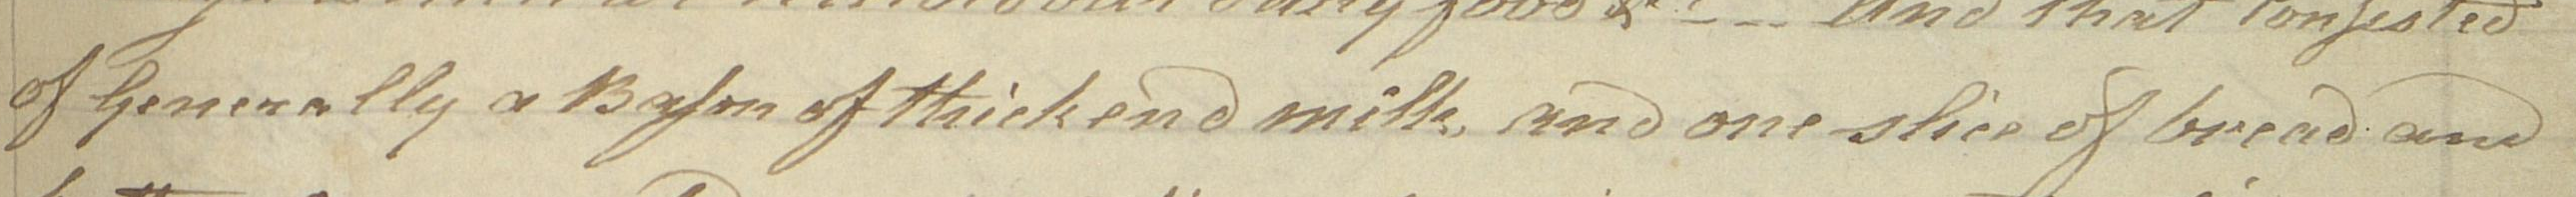of Generally a Bason of thick end milk and one slice of bread and
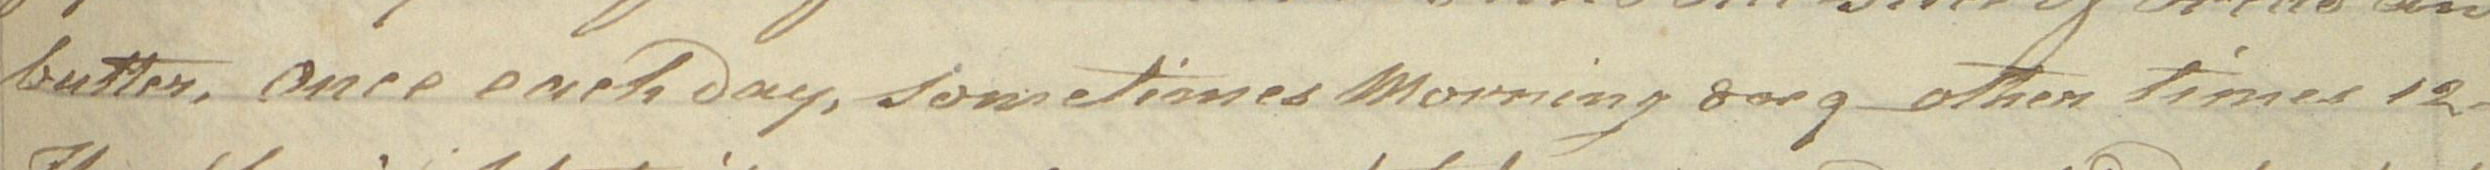butter, Once each day, sometimes Morning 8 or 9 other times 12
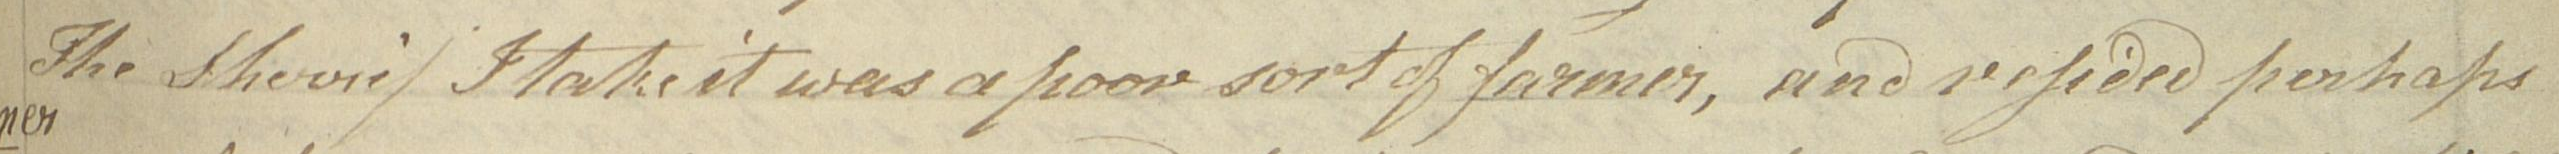The sherrif I take it was a poor sort of farmer, and resided perhaps
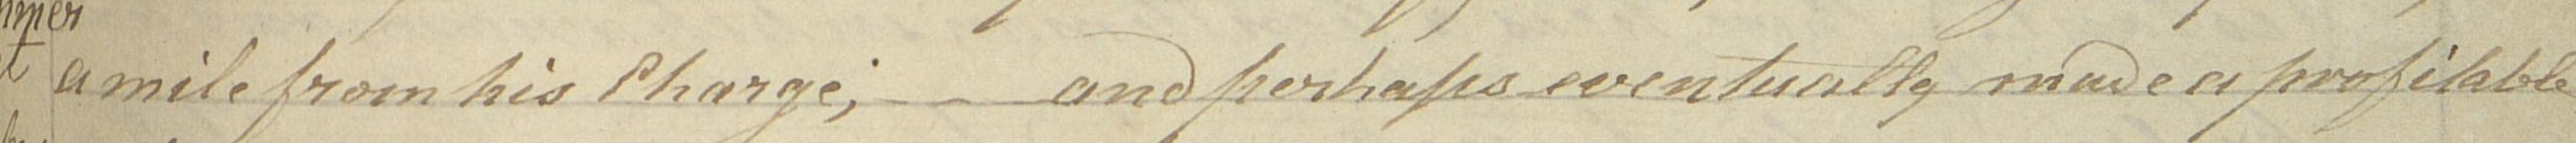a mile from his Charge; and perhaps eventually made a profitable
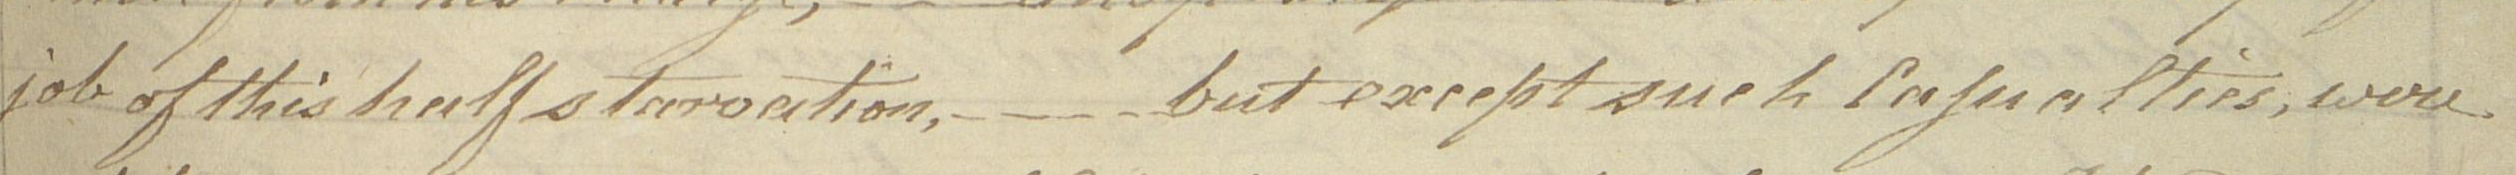job of this half staroation, but except such Casualties, were
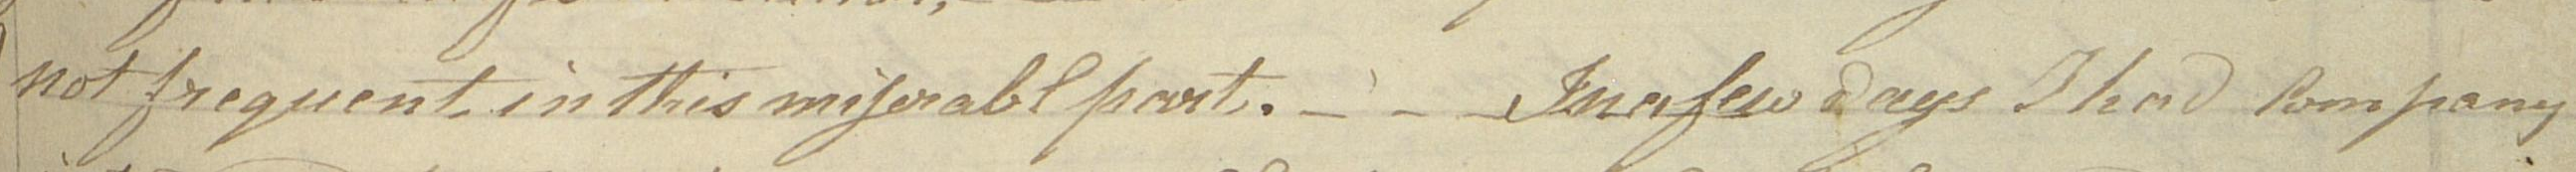not frequent in this miserabl part. In a few days I had Company
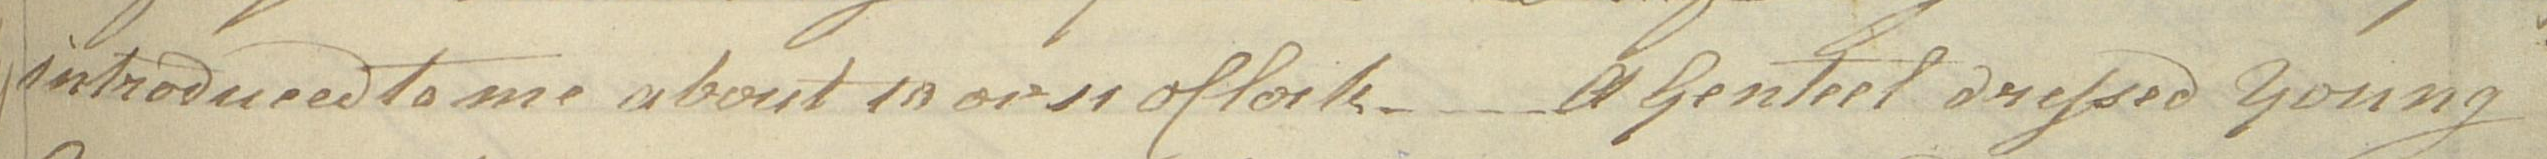Introduced to me about 10 or 11 OClock A Genteel dressed Young
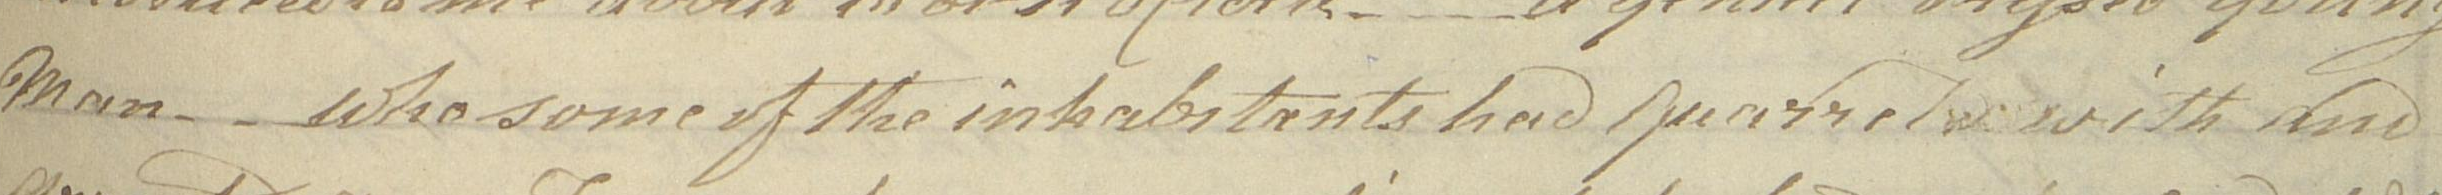Man who some of the inhabitants had quarrel with and
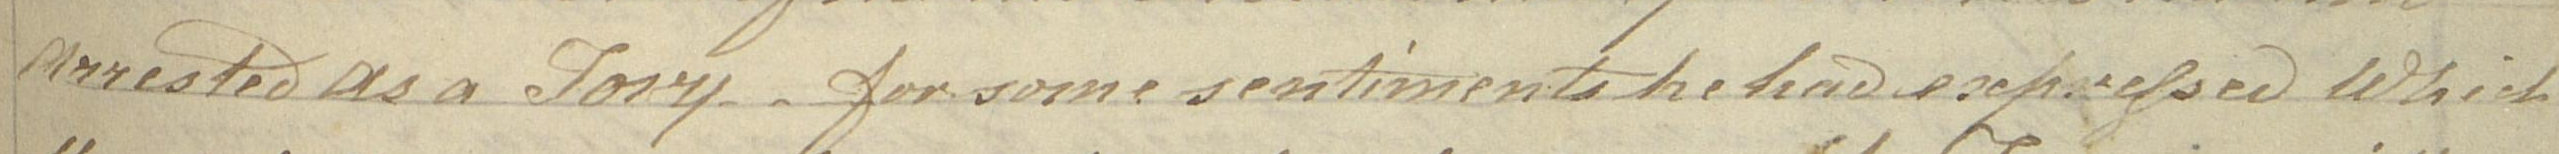Arrested as a Tory for some sentiments he had expressed Which
